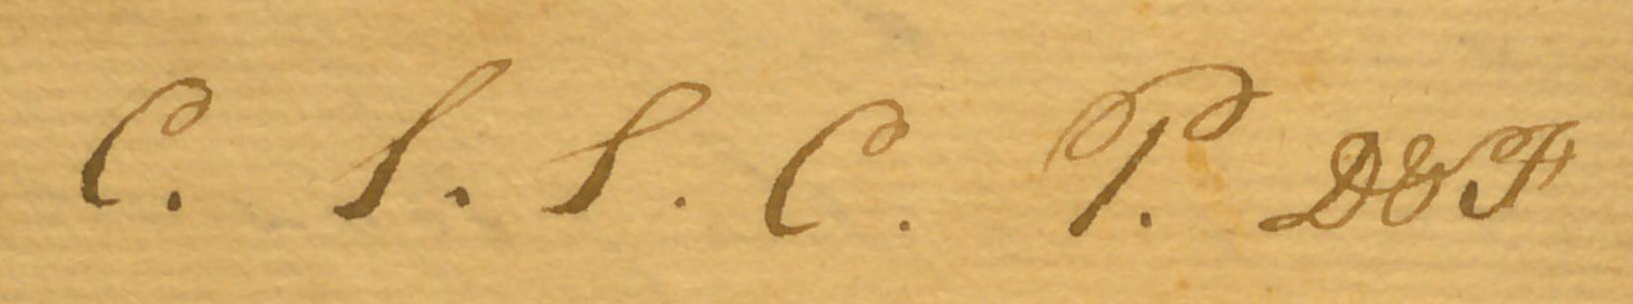C. S. S. C. P. D&F
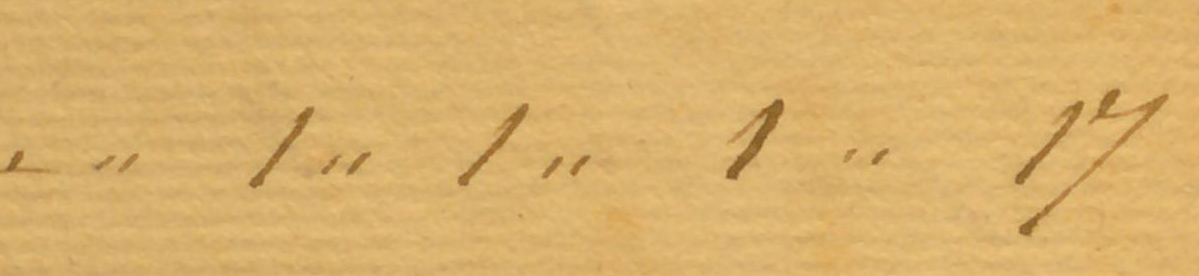.. 1.. 1.. 1.. 17
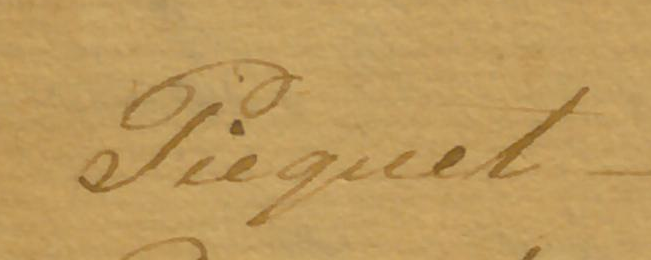Picquet
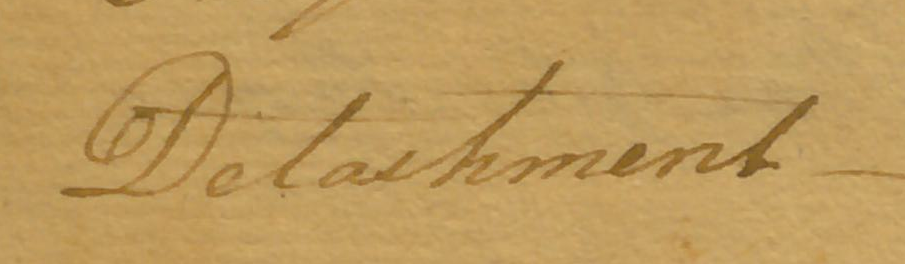Detachment
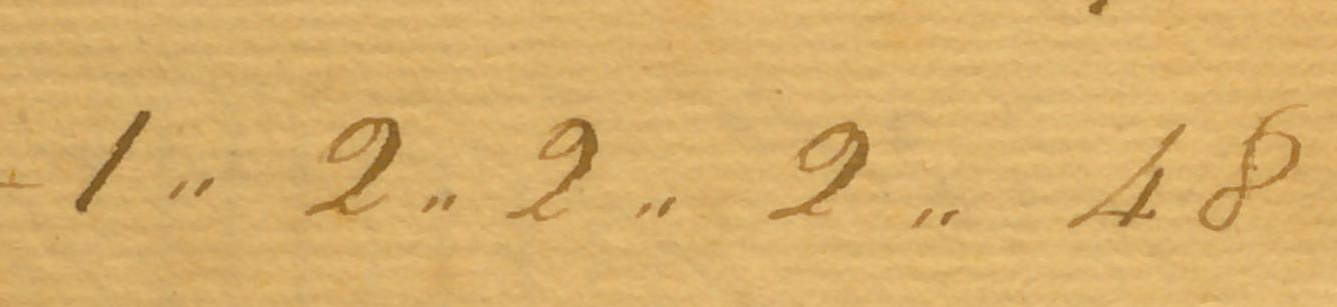1.. 2.. 2.. 2.. 48
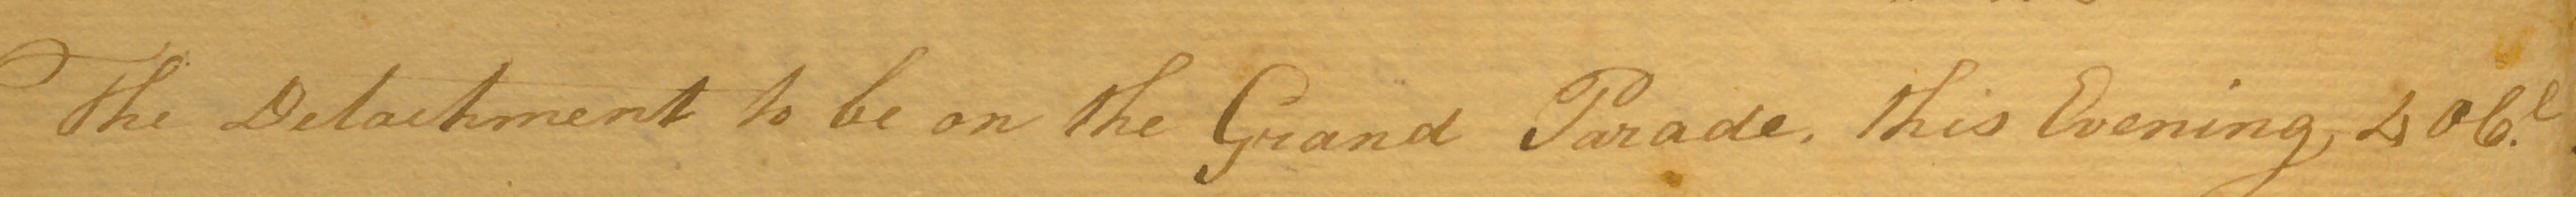The Detachment to be on the Grand Parade this evening 4 oC^l.
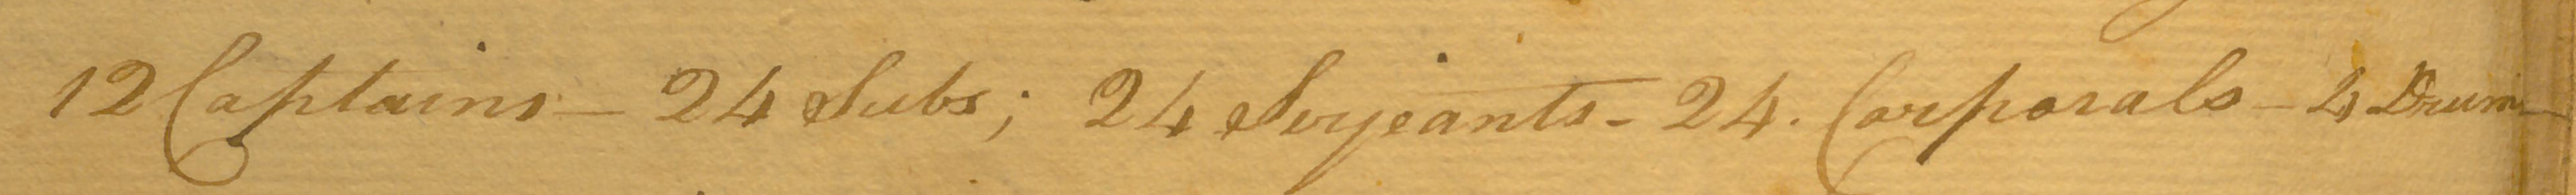12 Captains- 24 Subs; 24 Serjeants= 24. Corporals- 4 Drums
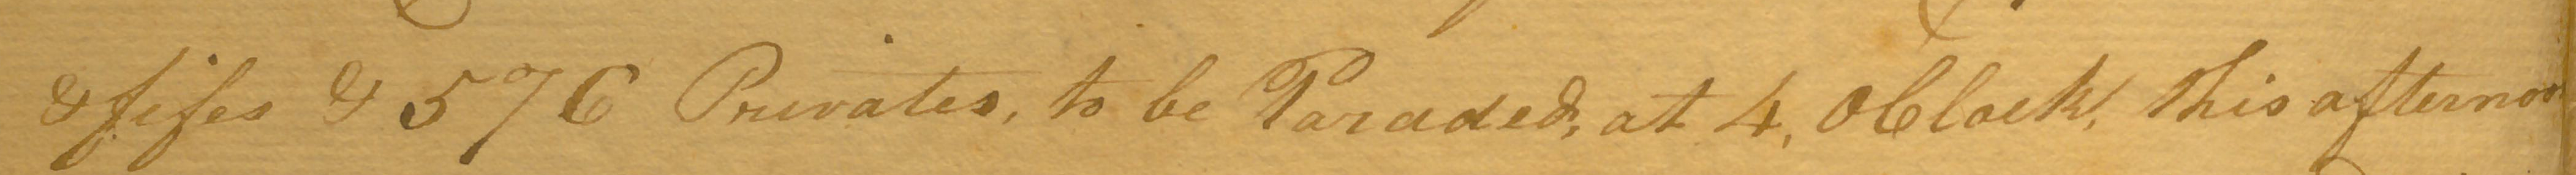& fifes & 576 Privates, to be Paraded at 4. oClock this afternoon
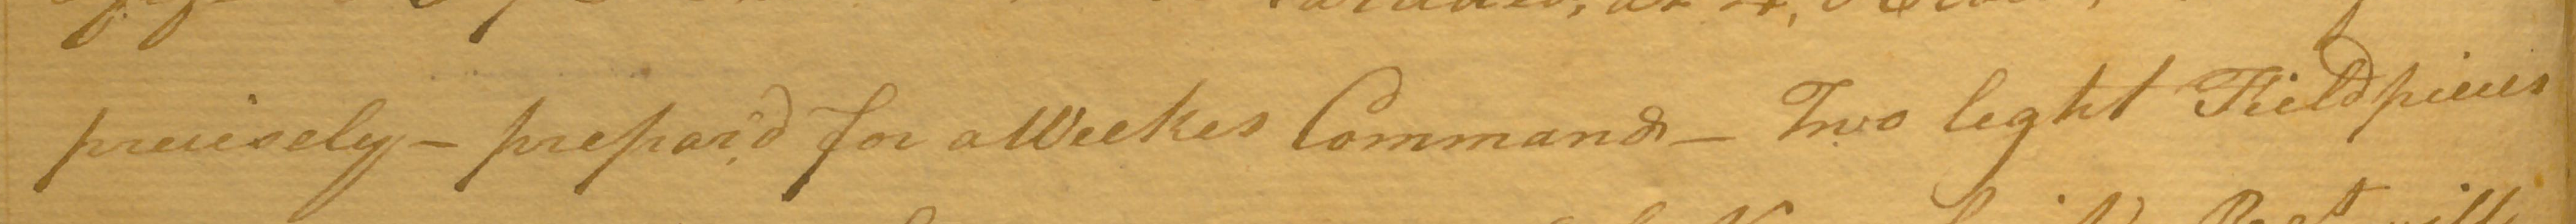precisely- prepar'd for a Weekes Command- Two light Field pieces
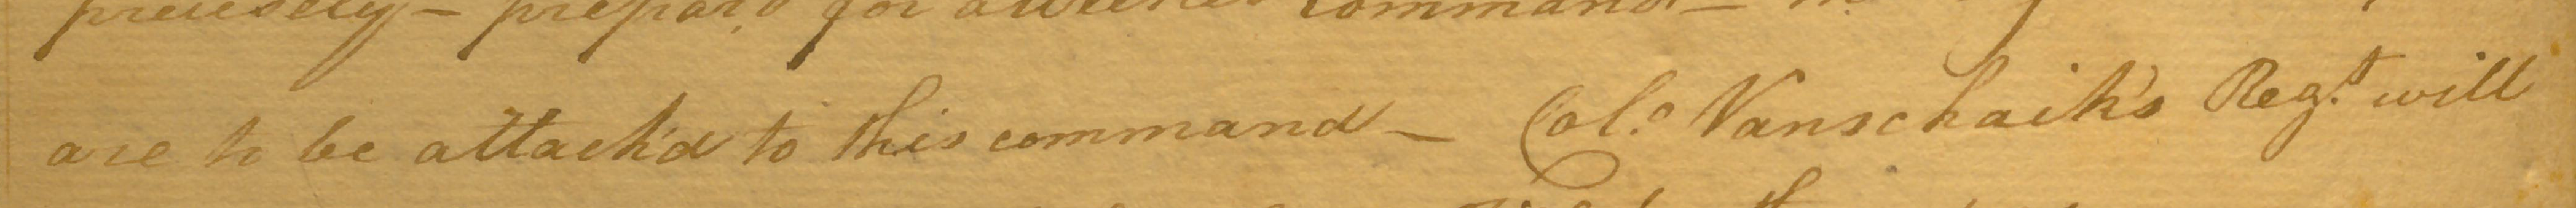are to be attach'd to this command- Col^o. Vanschaik's Reg^t. will
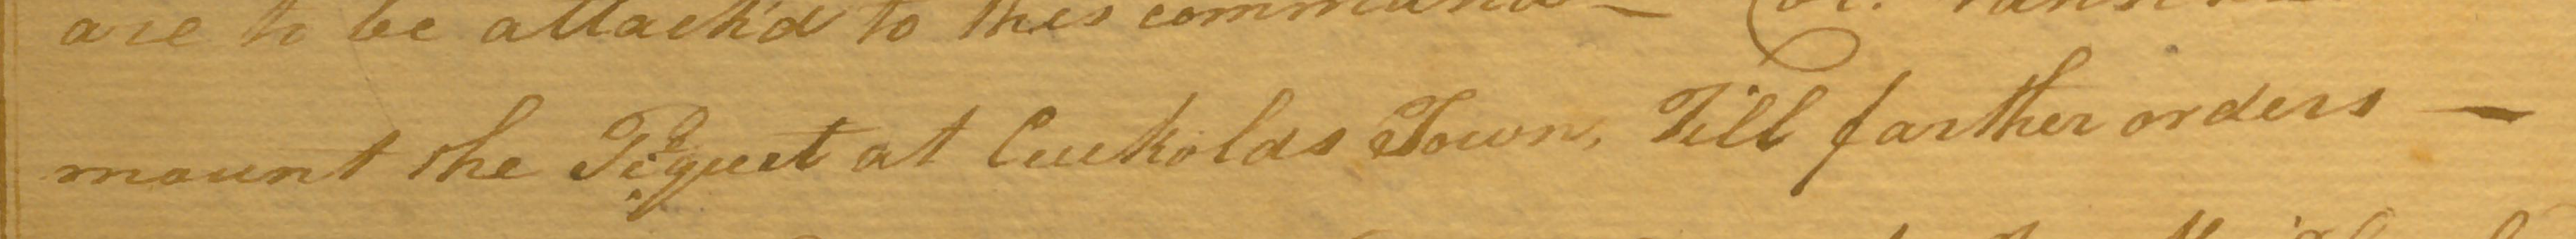mount the Picquet at Cuckolds Town Till farther orders-
